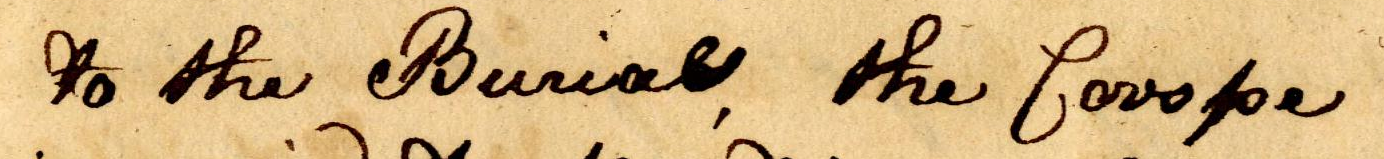to the Burial, the Corspe
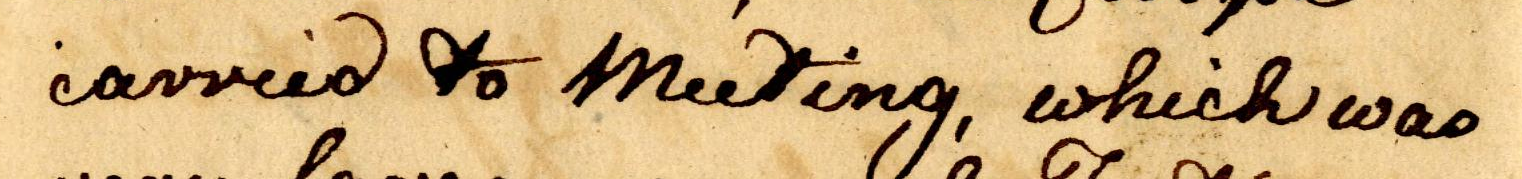carried to Meeting, which was
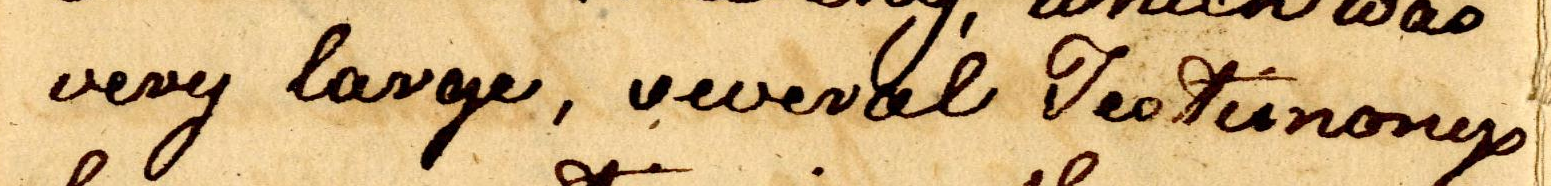very large, several Testimonys
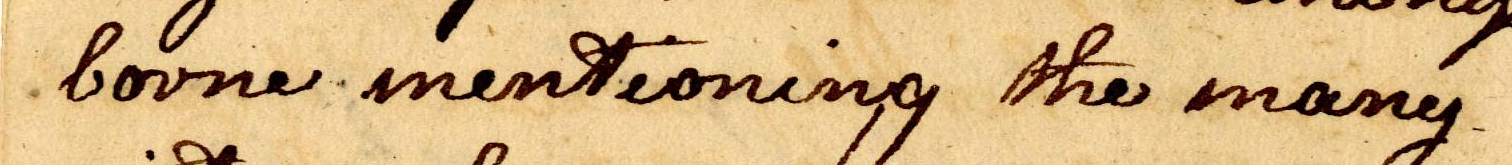borne mentioning the many
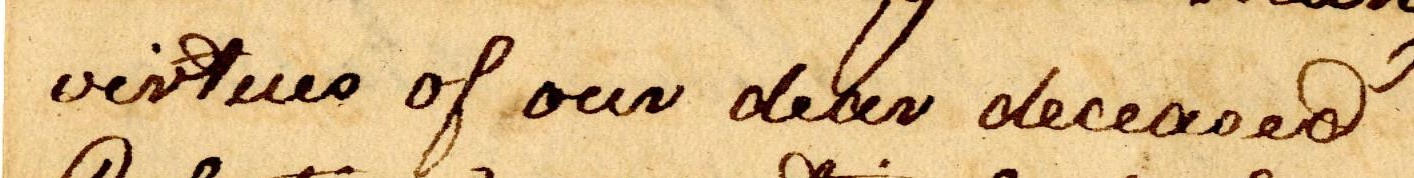virtues of our dear deceased
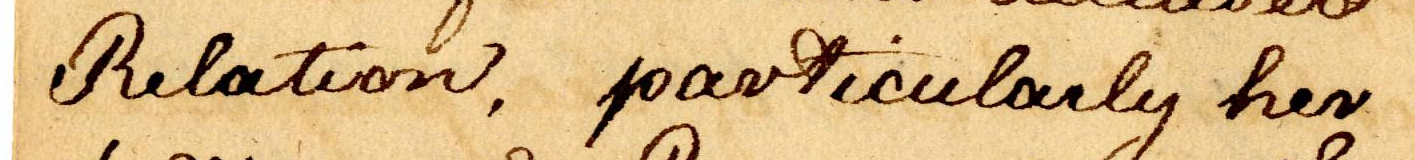Relation, particularly her
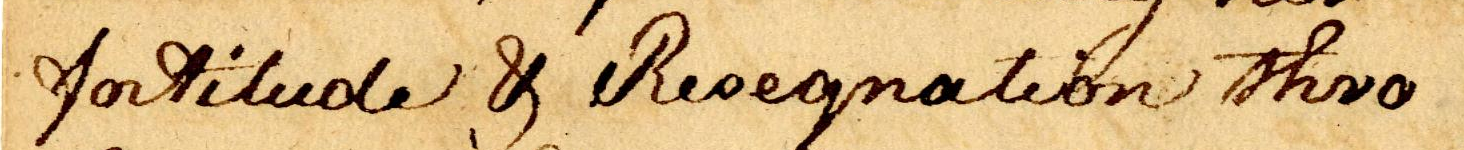fortitude & Resegnation thro'
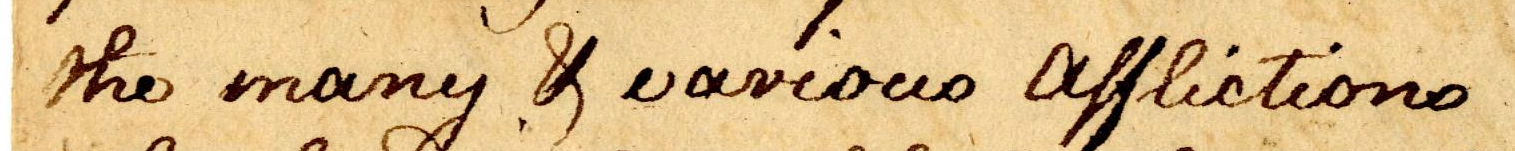the many & various Afflictions
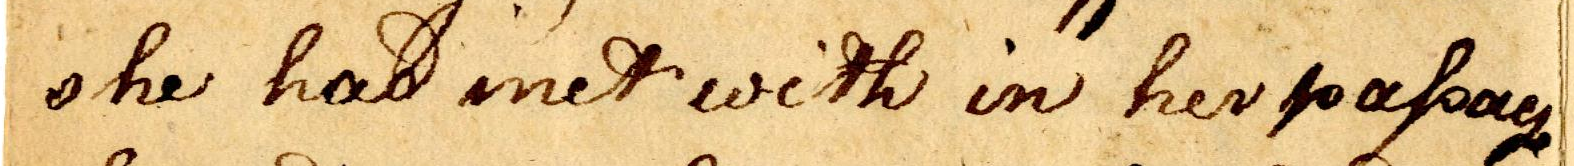she had met with in her passag
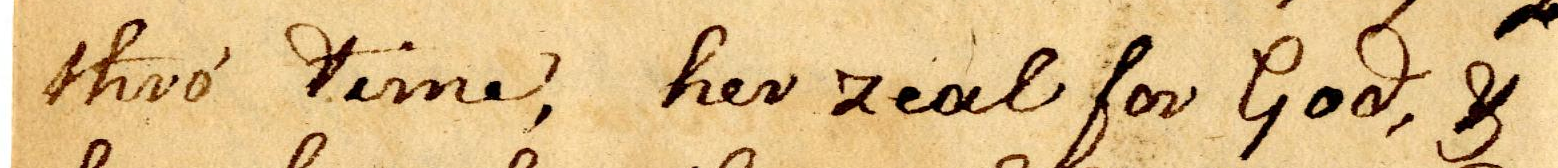thro' time, her zeal for God, &
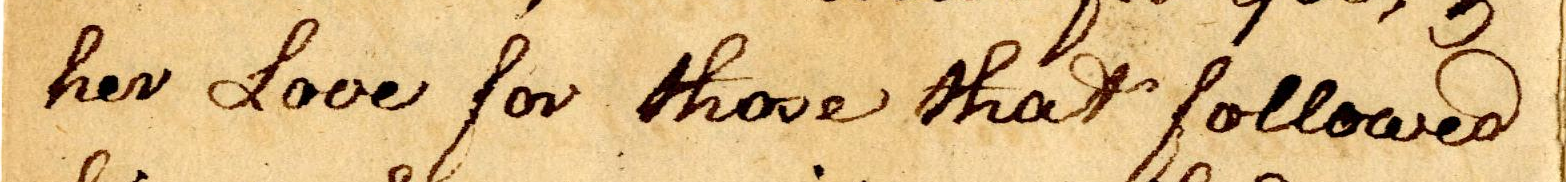her Love for those that followed
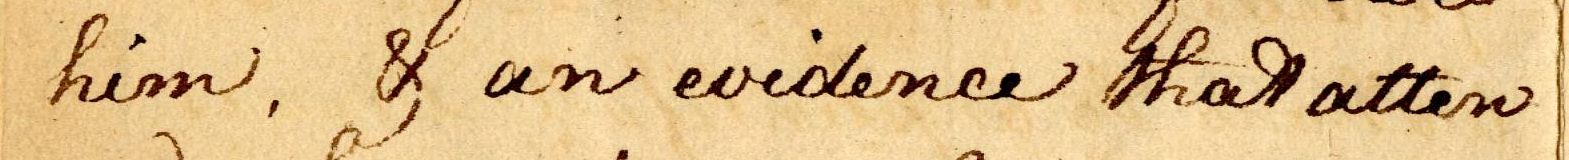him, & an evidence that atten
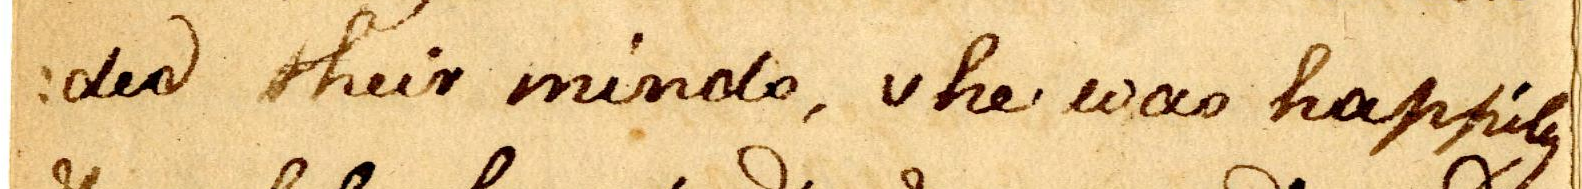-ded their minds, she was happily
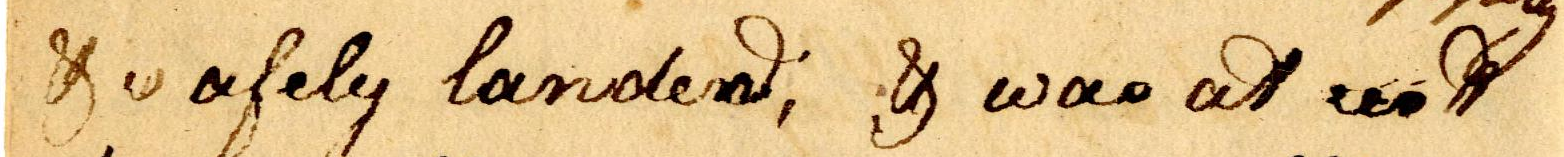& safely landed, & was at rest
